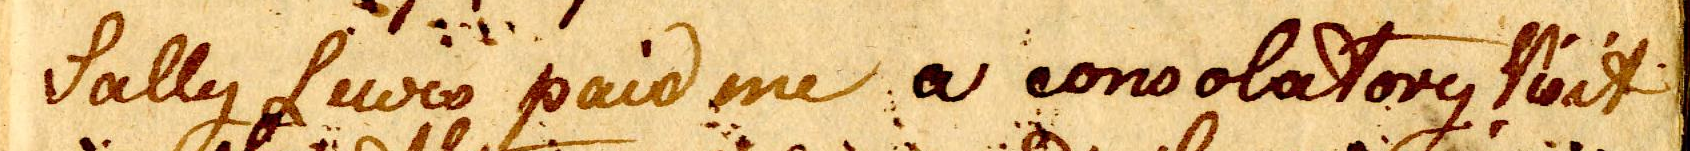Sally Lewis paid me a consolatory Visit
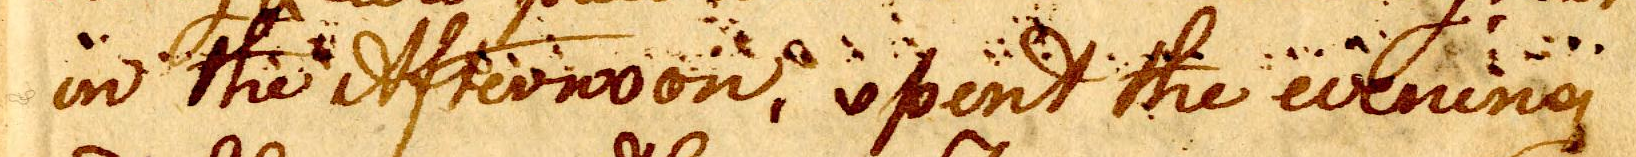in the Afternoon, spent the evening
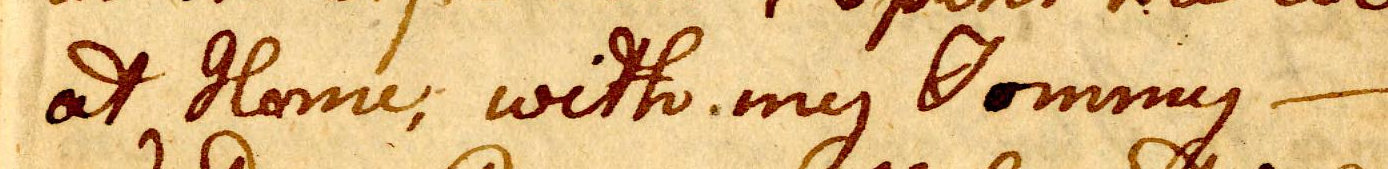at Home, with my Tommy -
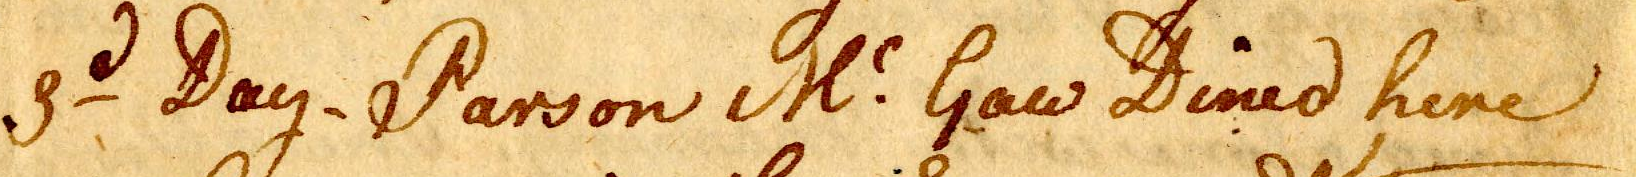3^d Day - Parson M^.cGaw Dined here
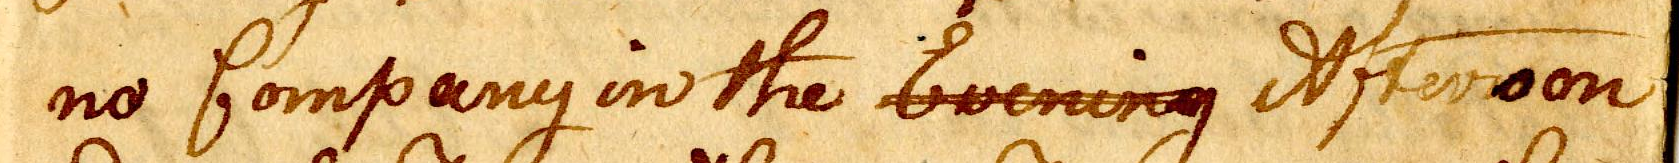no Company in the [_______] Afternoon
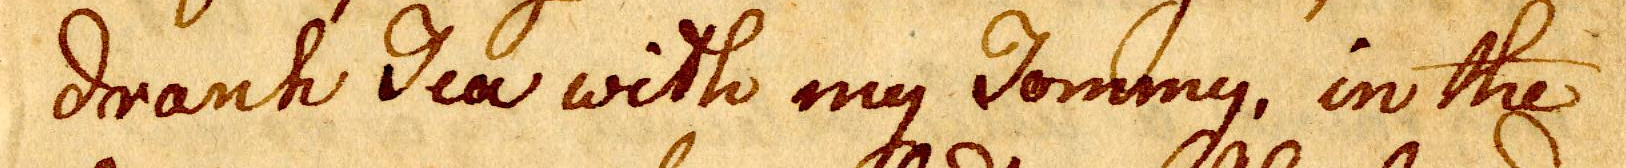drank Tea with my Tommy, in the
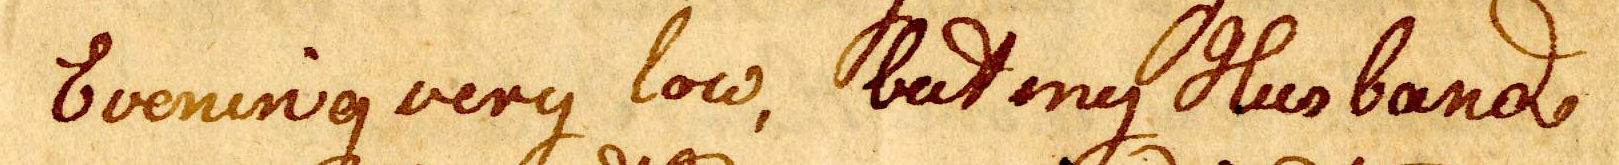Evening very low, but my Husband
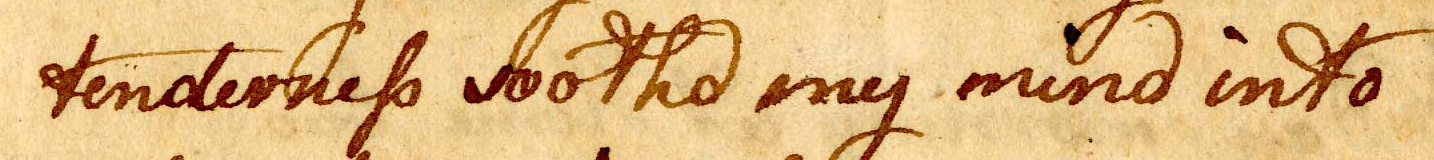tenderness soothd my mind into
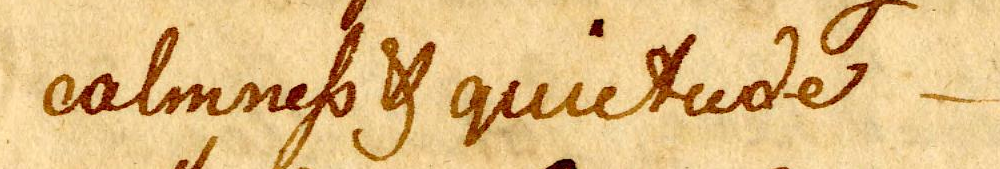calmness & quietude -
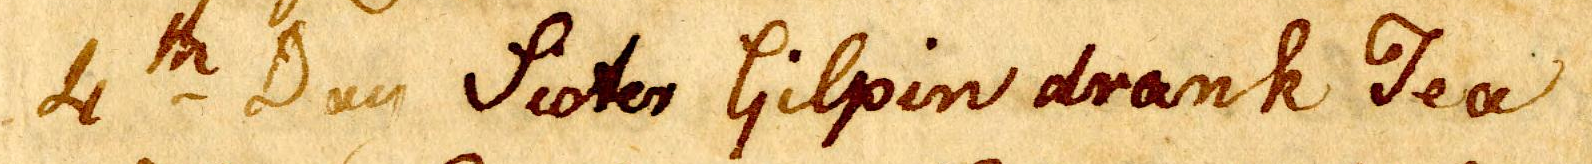4^th Day Sister Gilpin drank Tea
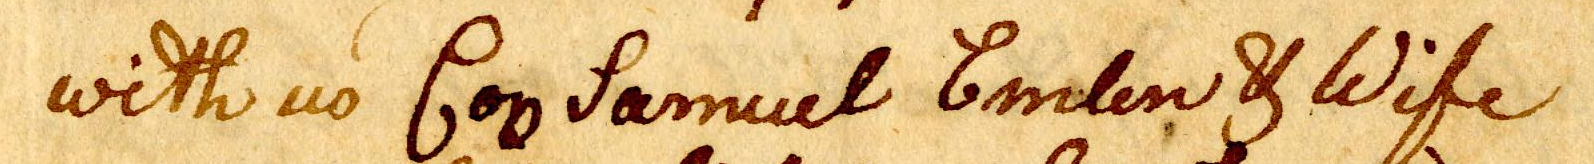with us Coz Samuel Emlen & Wife
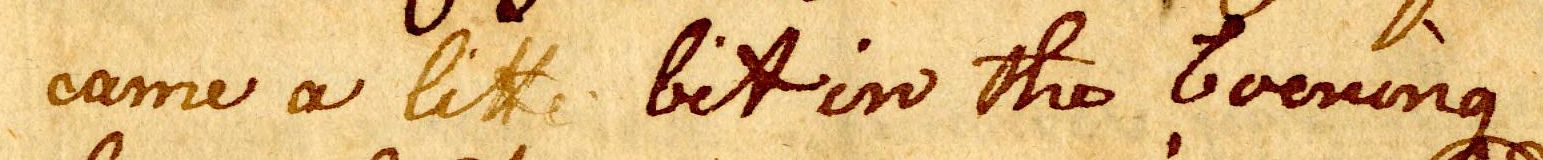came a litte bit in the Evening
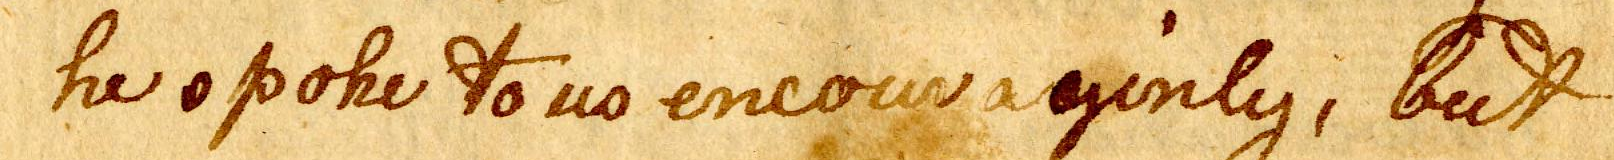he spoke to us encouraginly, but
